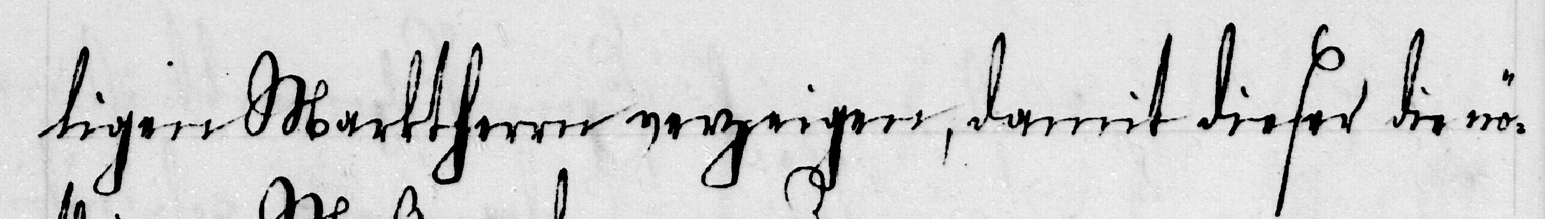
ligen Marktherrn verzeigen, damit dieser die nö¬
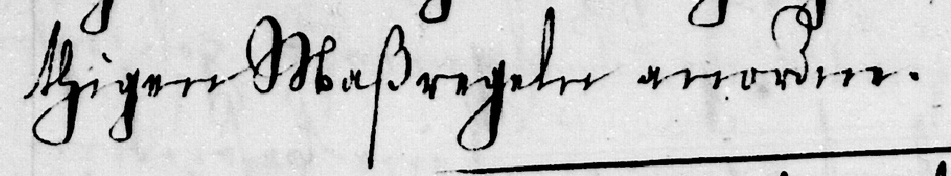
thigen Maßregeln anordne.
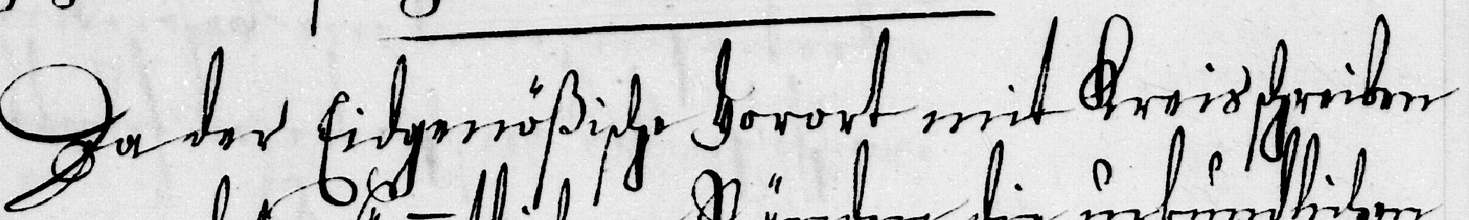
Da der Eidgenößische Vorort mit Kreisschreiben
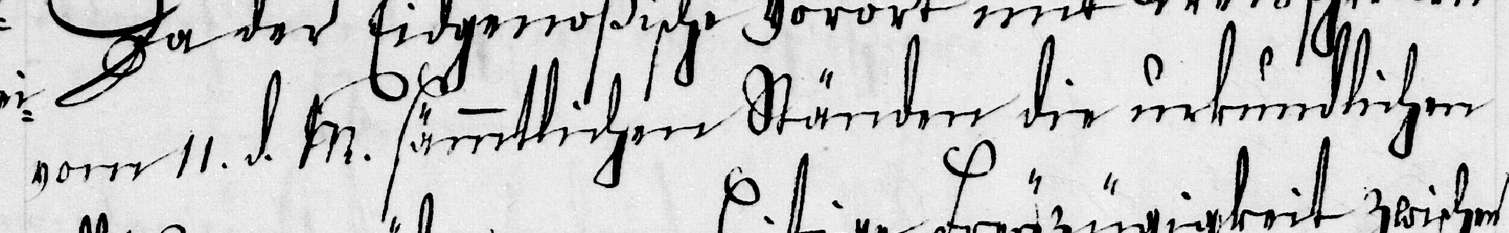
vom 11. d. M. sämmtlichen Ständen die urkundlichen
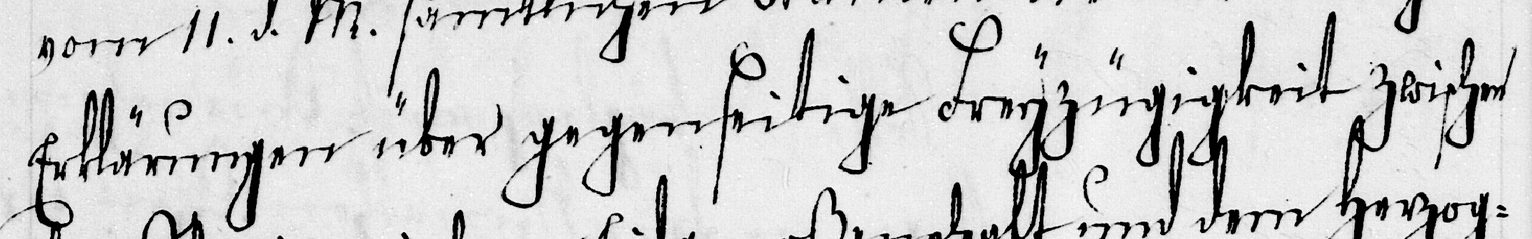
Erklärungen über gegenseitige Freyzügigkeit zwischen
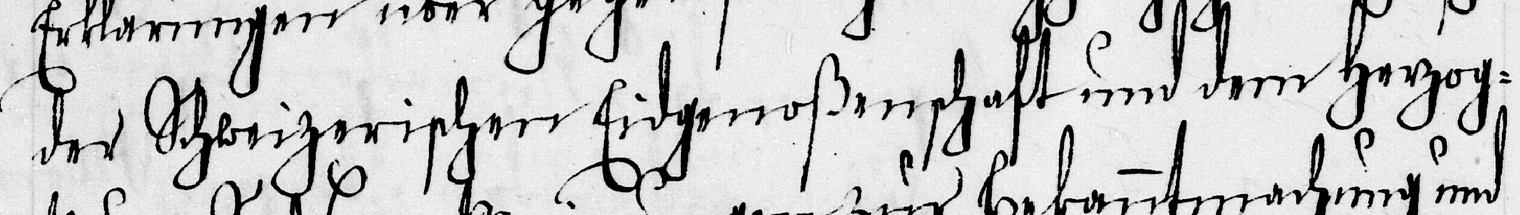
der Schweizerischen Eidgenoßenschaft und dem Herzog¬
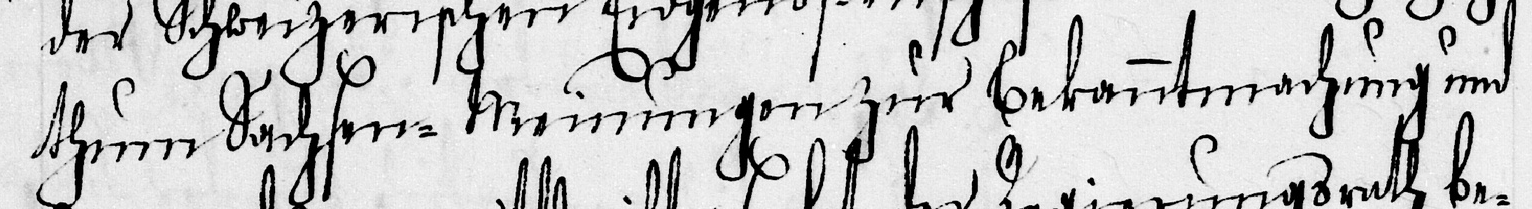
thum Sachsen-Meinungen zur Bekanntmachung und
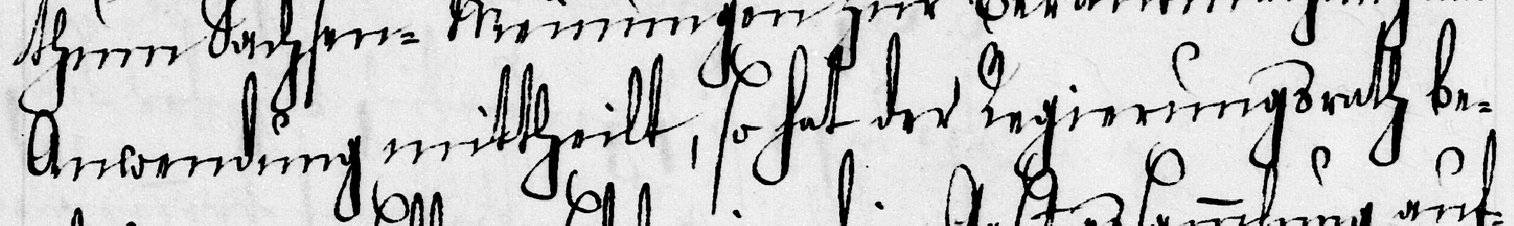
Anwendung mittheilt, so hat der Regierungsrath be¬
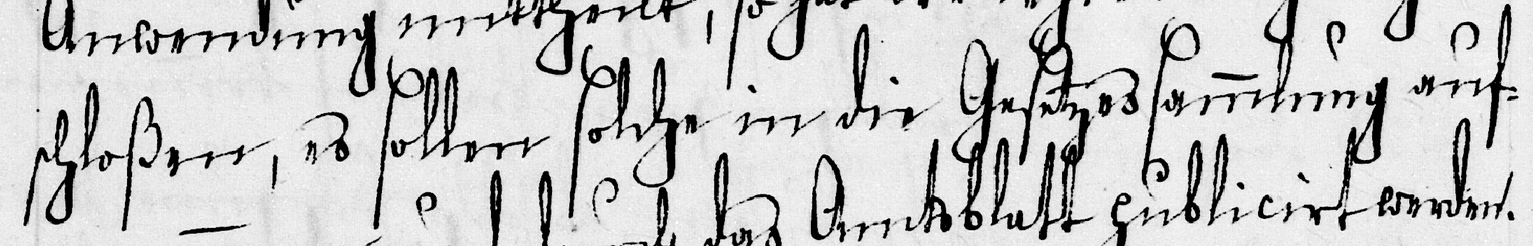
schloßen, es sollen solche in die Gesetzessammlung auf¬
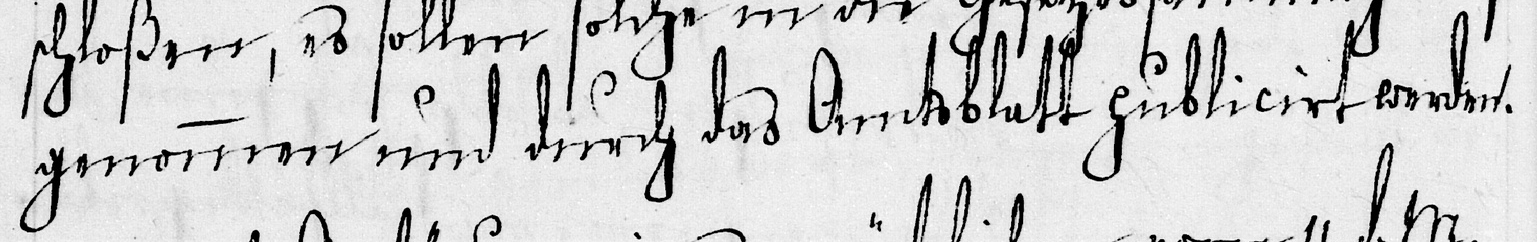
genommen und durch das Amtsblatt publicirt werden.
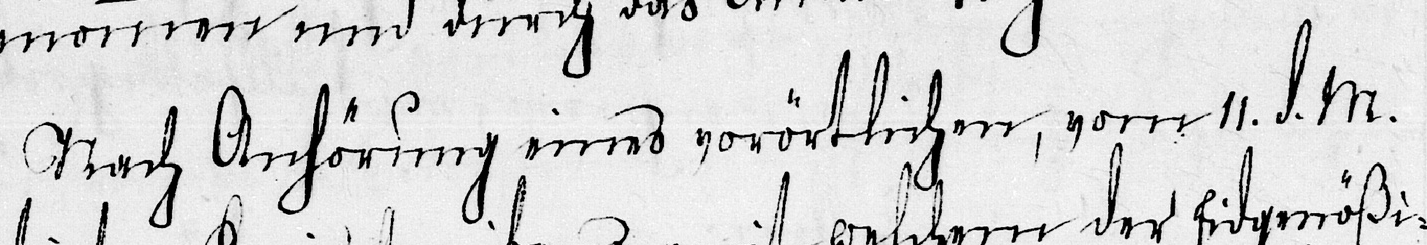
Nach Anhörung eines vorörtlichen, vom 11. d. M.
